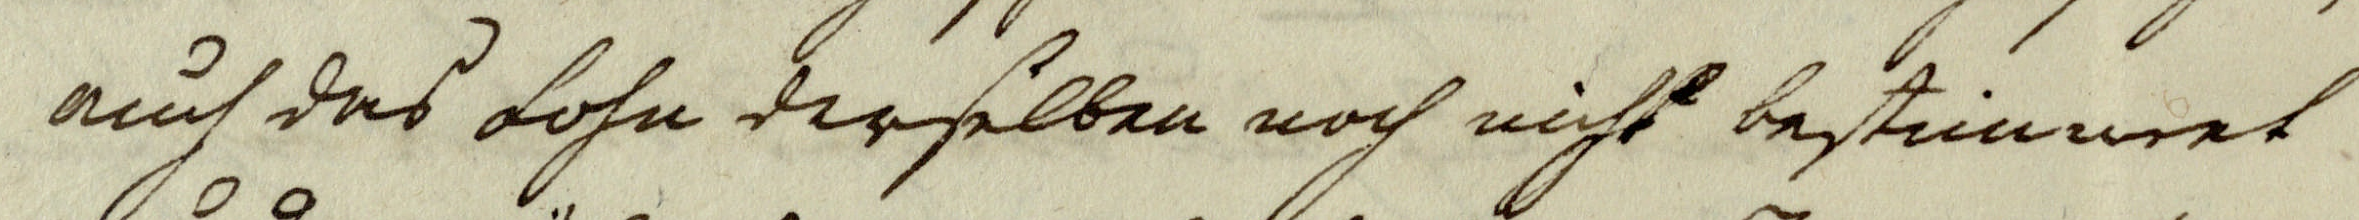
auch das Lohn derselben noch nicht bestimmt
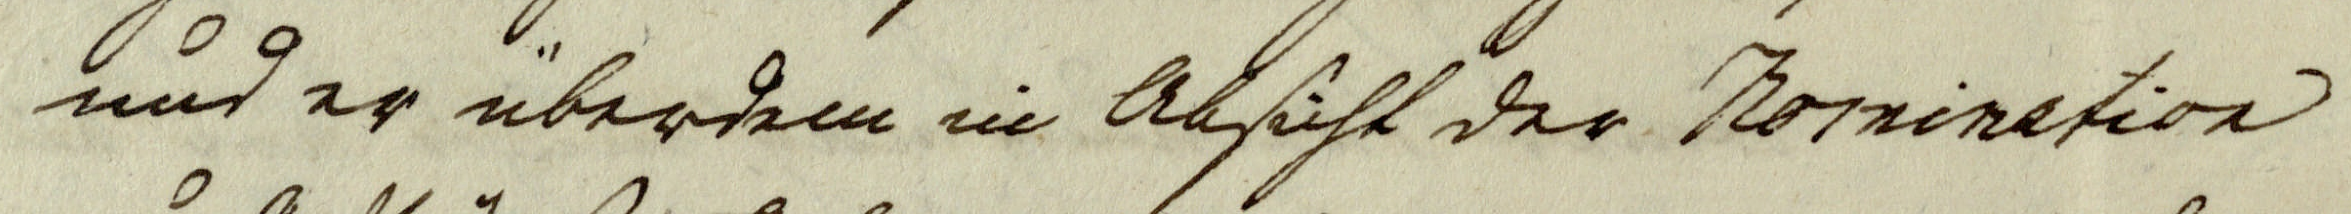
und er überdem in Absicht der Nomination
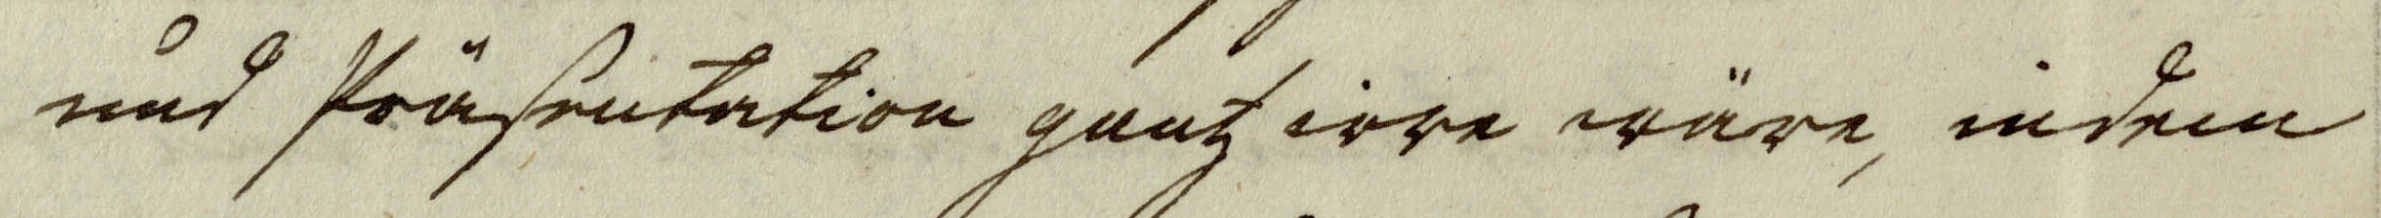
und Präsentation gantz irre wäre, indem
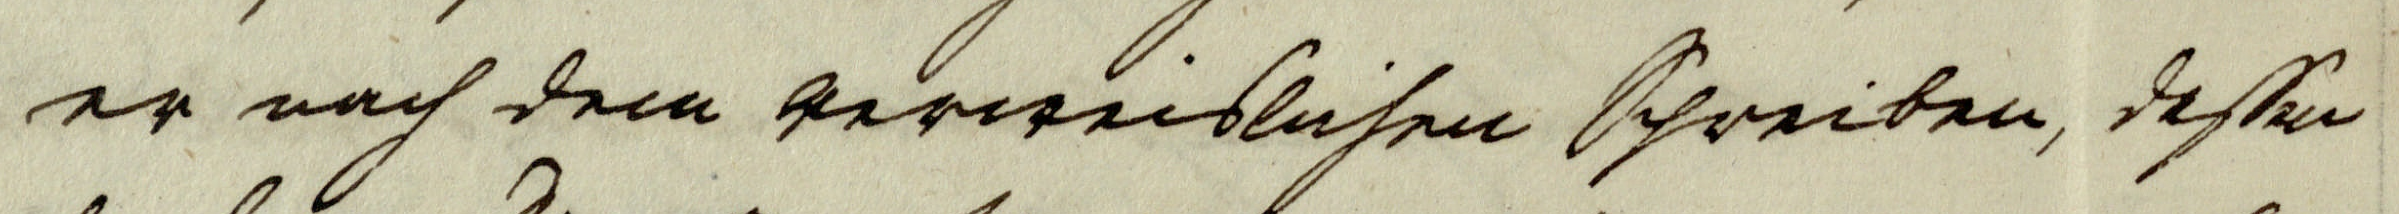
er nach dem verweislichen Schreiben, dessen
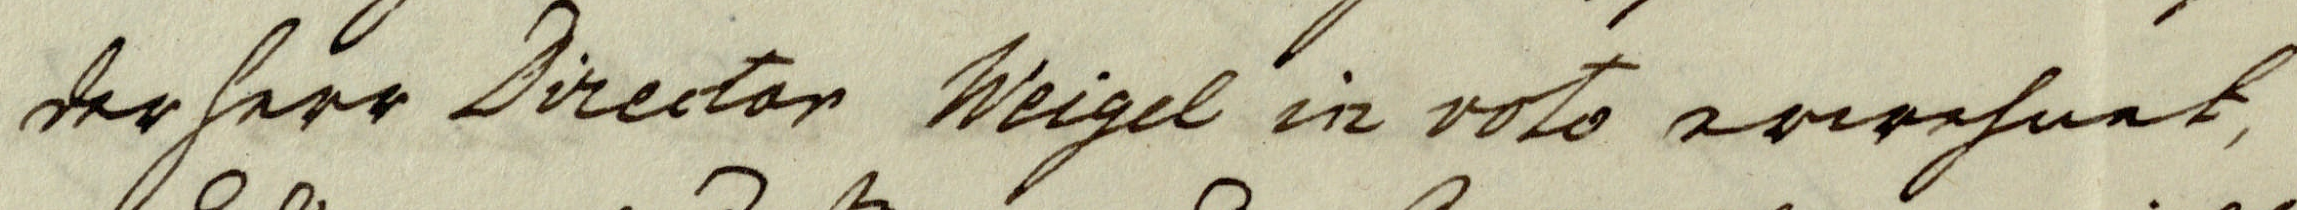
der Herr Director Weigel in voto erwehnet,
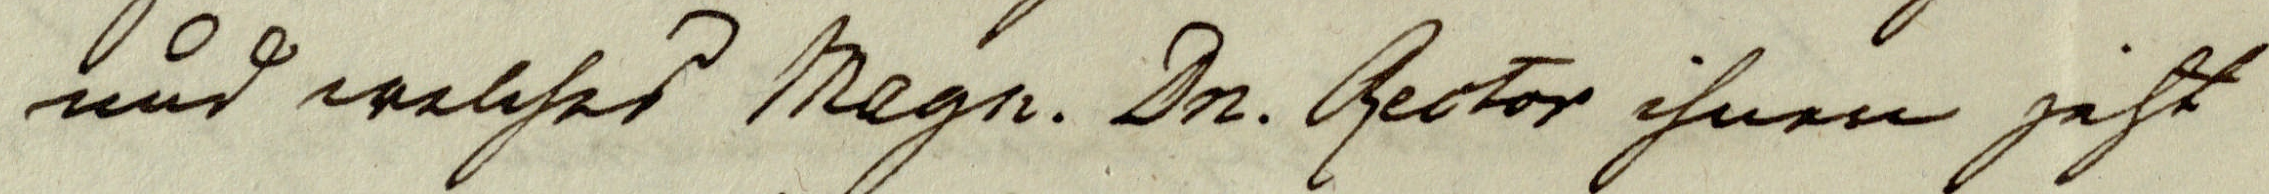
und welches Magn. Dn. Rector ihnen jetzt
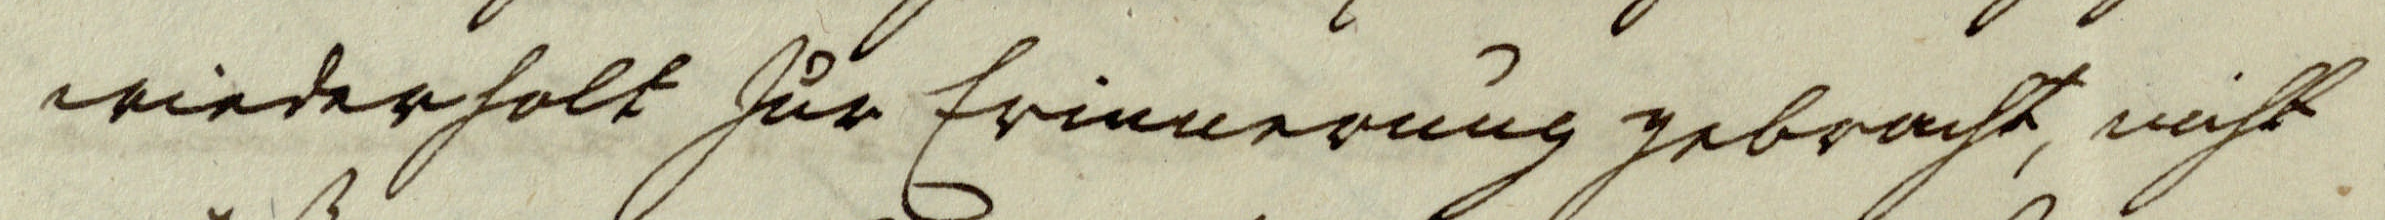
wiederholt zur Erinnerung gebracht, nicht
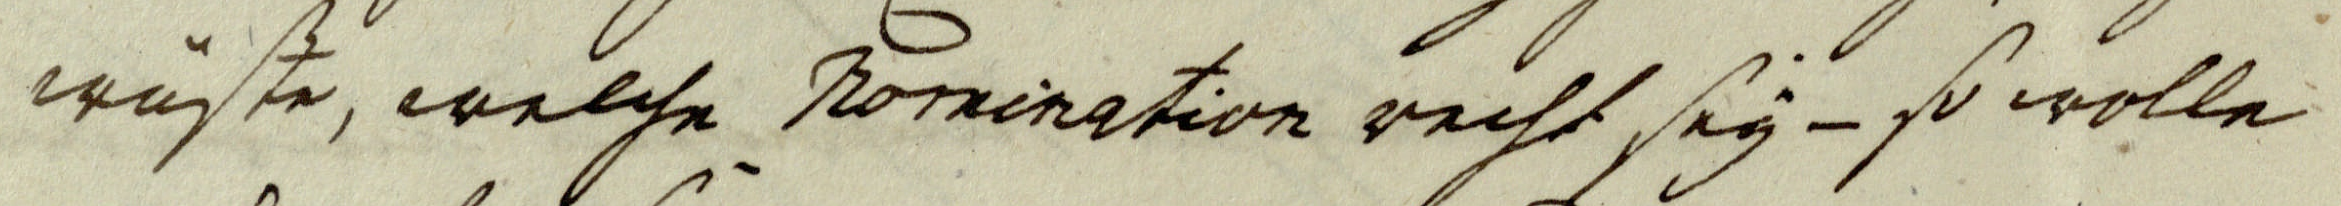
wüßte, welche Nomination recht seÿ — so wolle
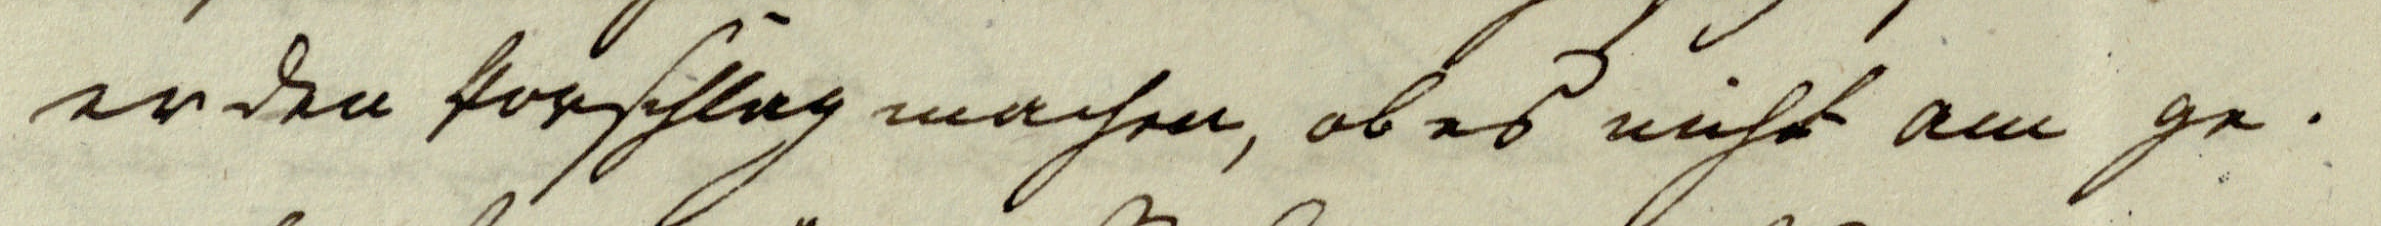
er den Vorschlag machen, ob es nicht am ge¬
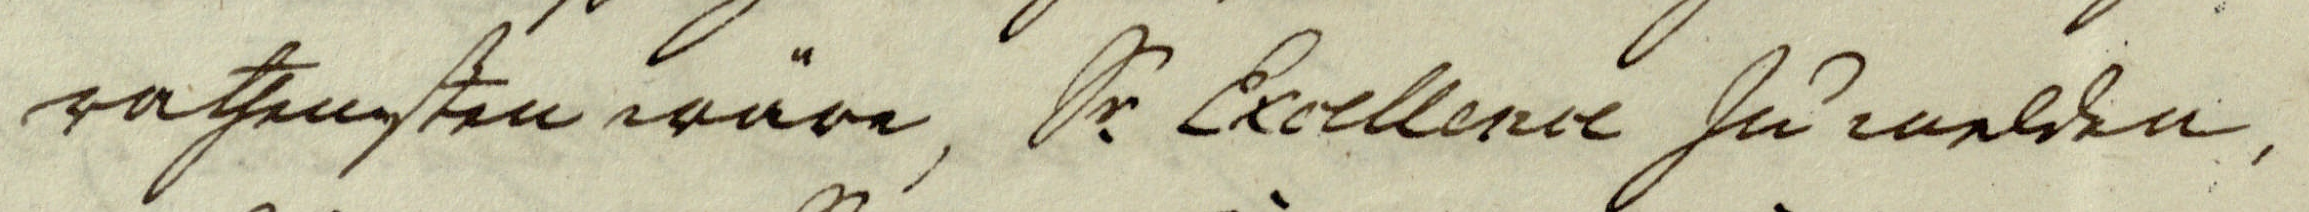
rathensten wäre, Sr. Excellence zu melden,
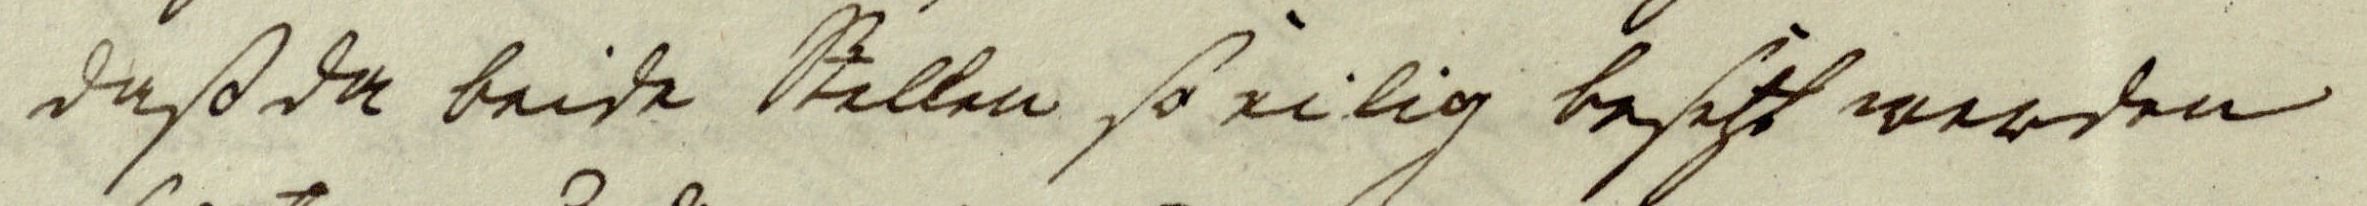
daß da beide Stellen so eilig besetzt werden
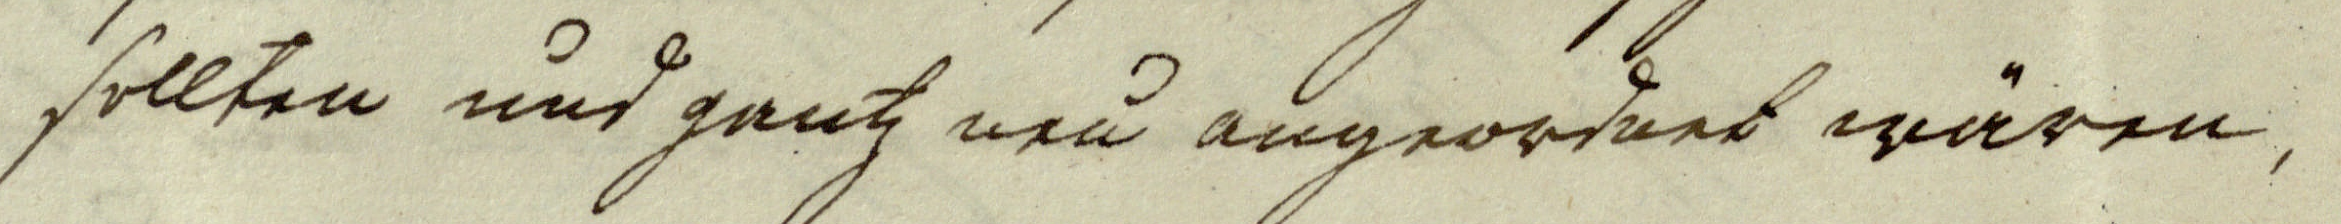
sollten und gantz neu angeordnet wären,
